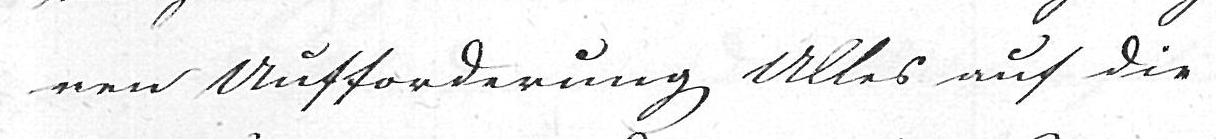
nen Aufforderung Alles auf die
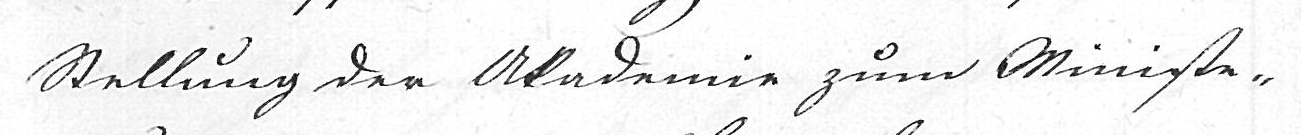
Stellung der Akademie zum Ministe-
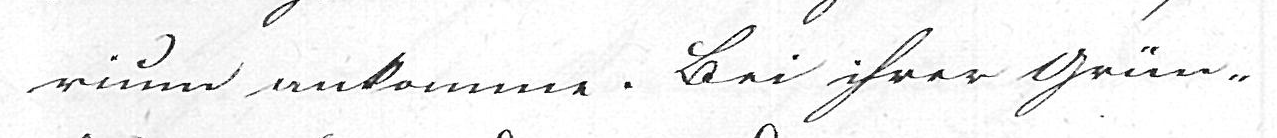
und ankomme. Bei ihrer Grün-
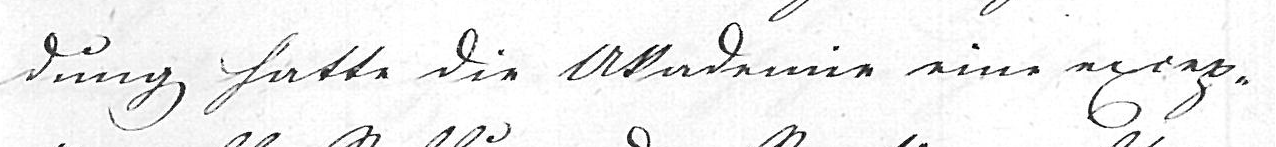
dung hatte die Akademie eine excep-
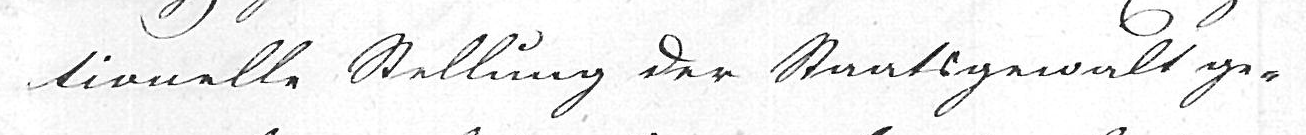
tionelle Stellung der Staatsgewalt ge-
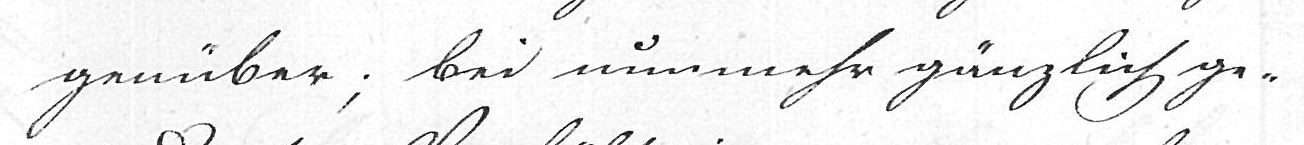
genüber; bei nunmehr gänzlich ge-
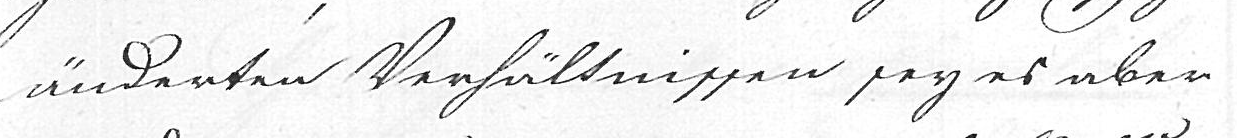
änderten Verhältnissen sey es aber
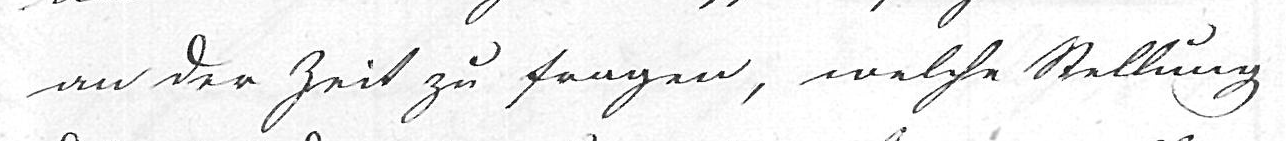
an der Zeit zu fragen, welche Stellung
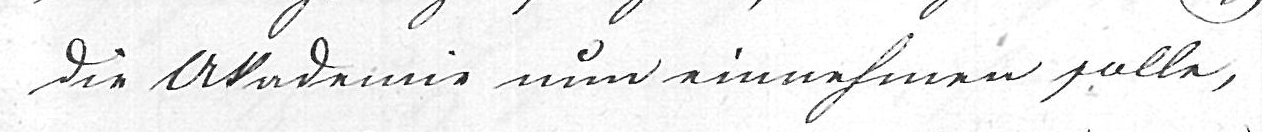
die Akademie nun einnehmen solle,
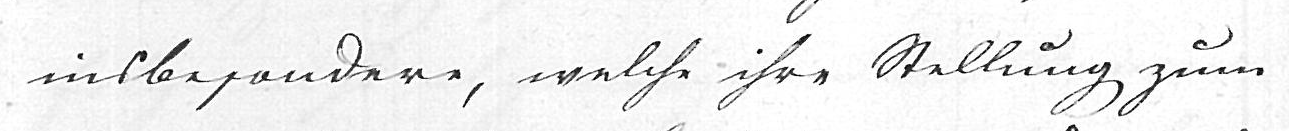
insbesondere, welche ihrer Stellung zum
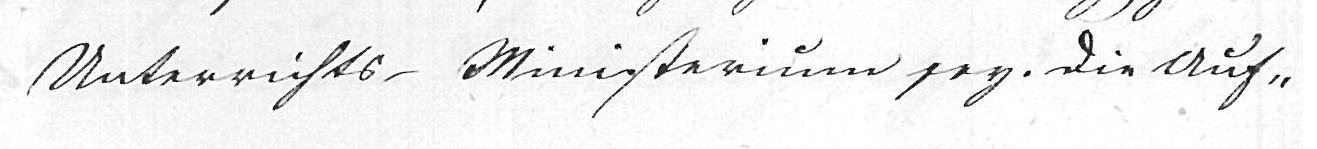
Unterrichts-Ministerium sey. Die Auf-
